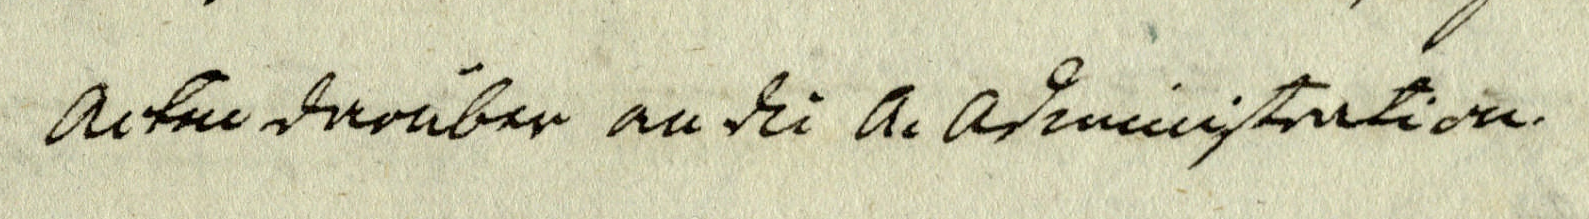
Acten darüber an die A. Administration.
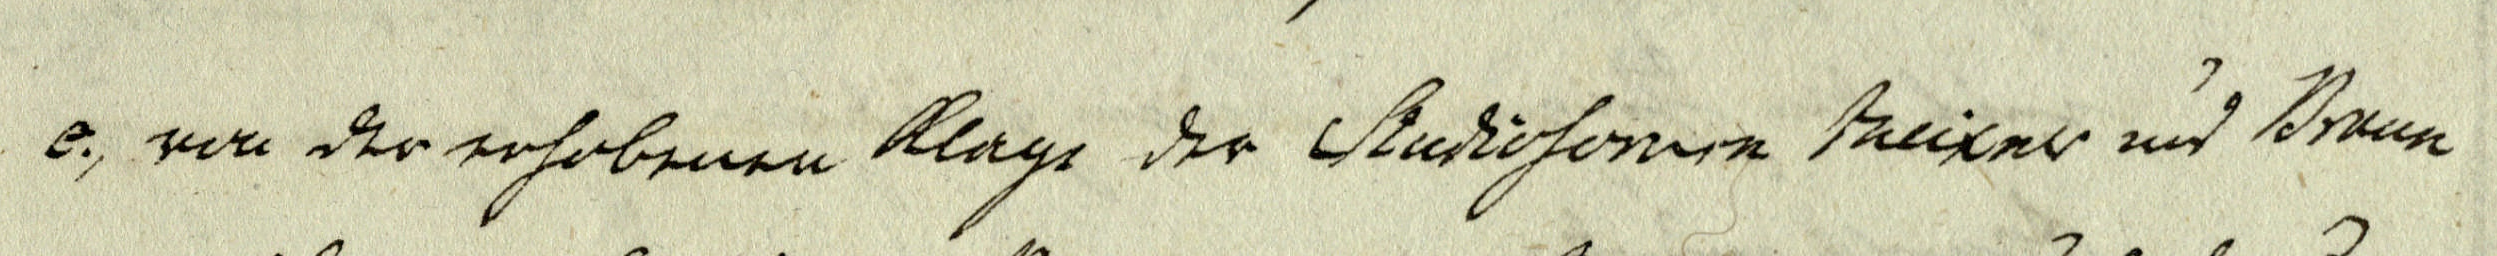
e., von der erhobenen Klage der Studiosorum Meixner und Braun
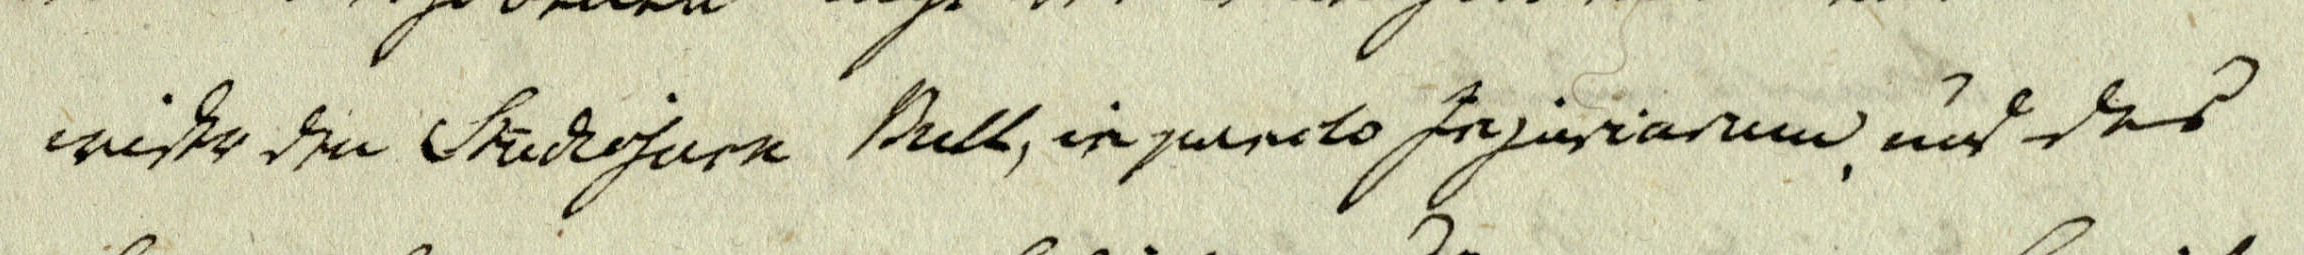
wider den Studiosum Bult, in puncto Injuriarum und des
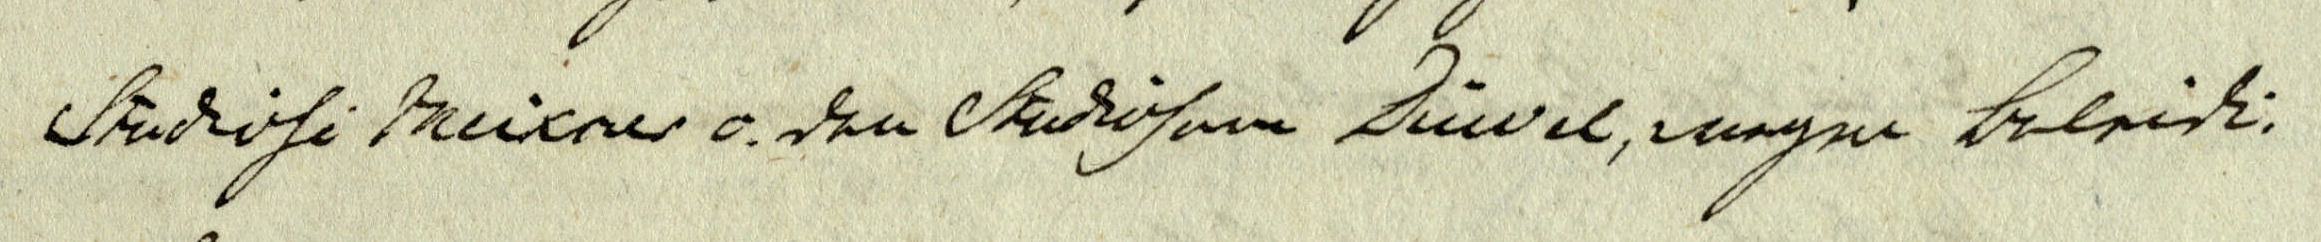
Studiosi Meixner c. den Studiosum Düwel, wegen Beleidi¬
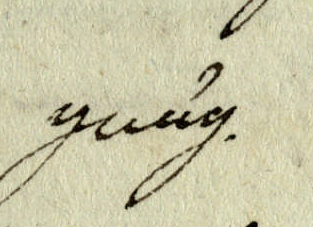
gung.
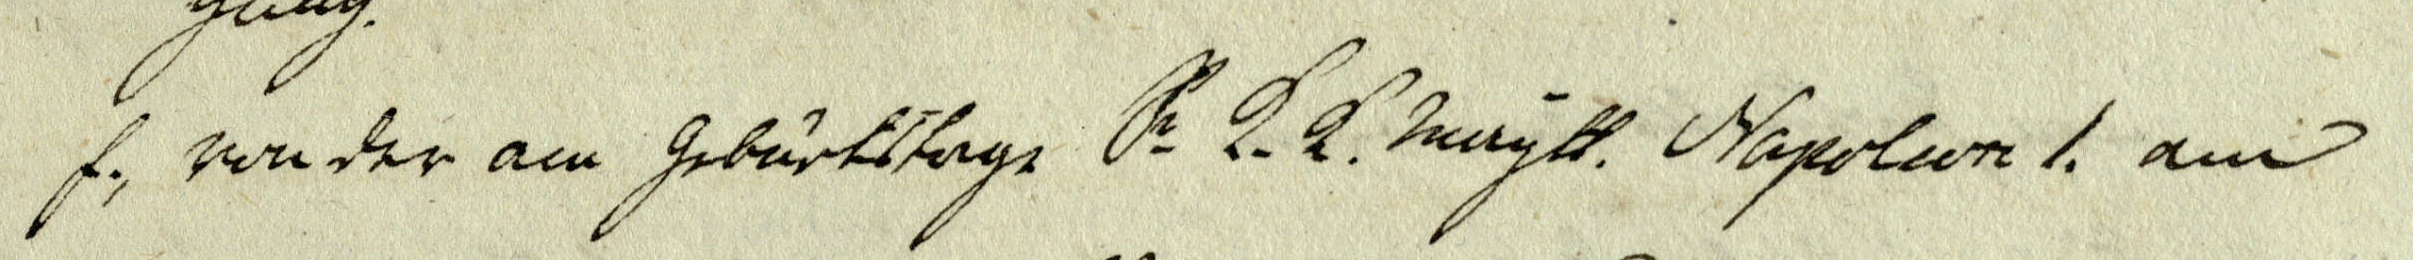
f. von der am Geburtstage Sr. K. K. Maÿtt. Napoleon I. am
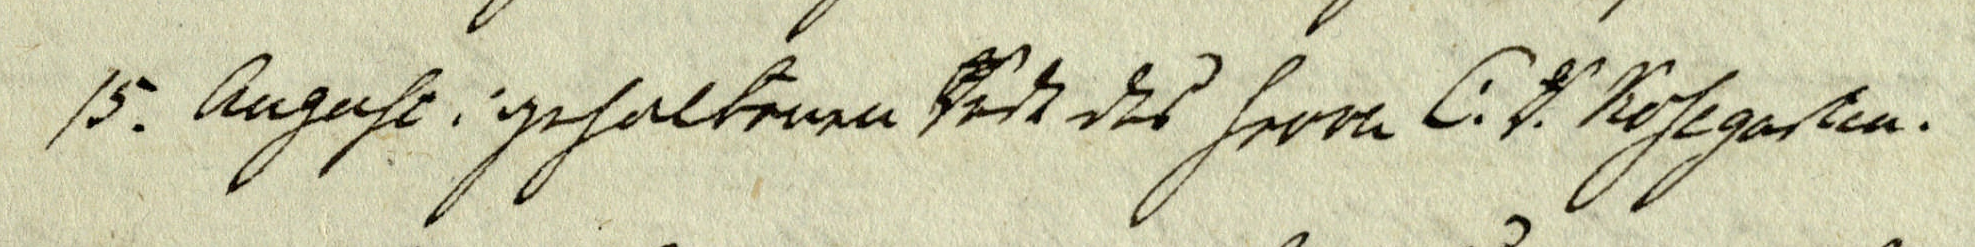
15. August. gehaltenen Rede des Herrn C. R. Kosegarten.
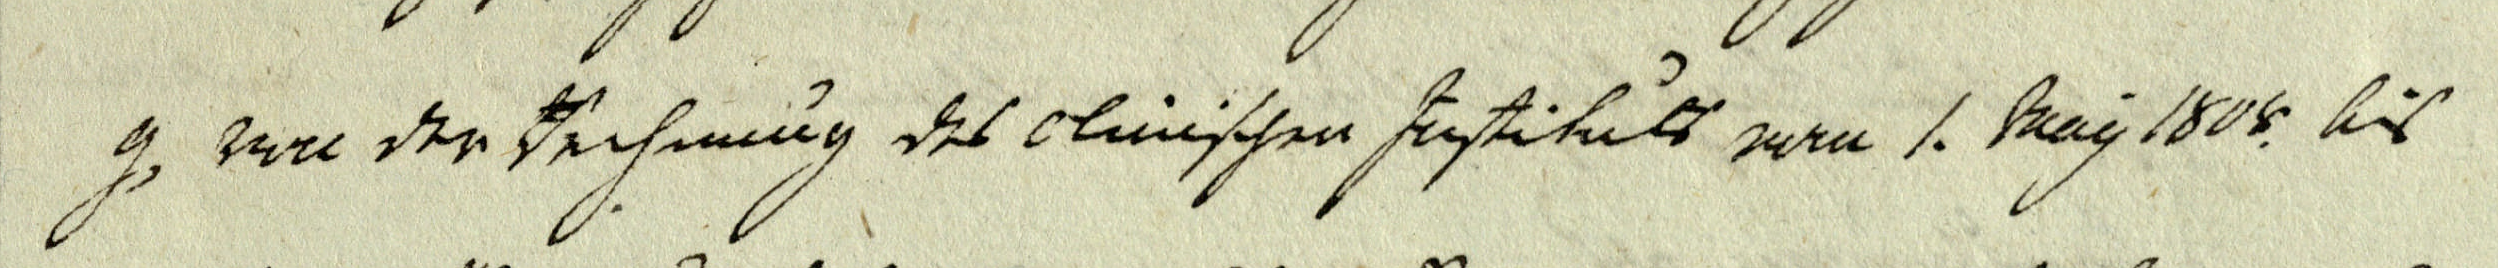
g., von der Rechnung des clinischen Instituts vom 1. Maÿ 1808 bis
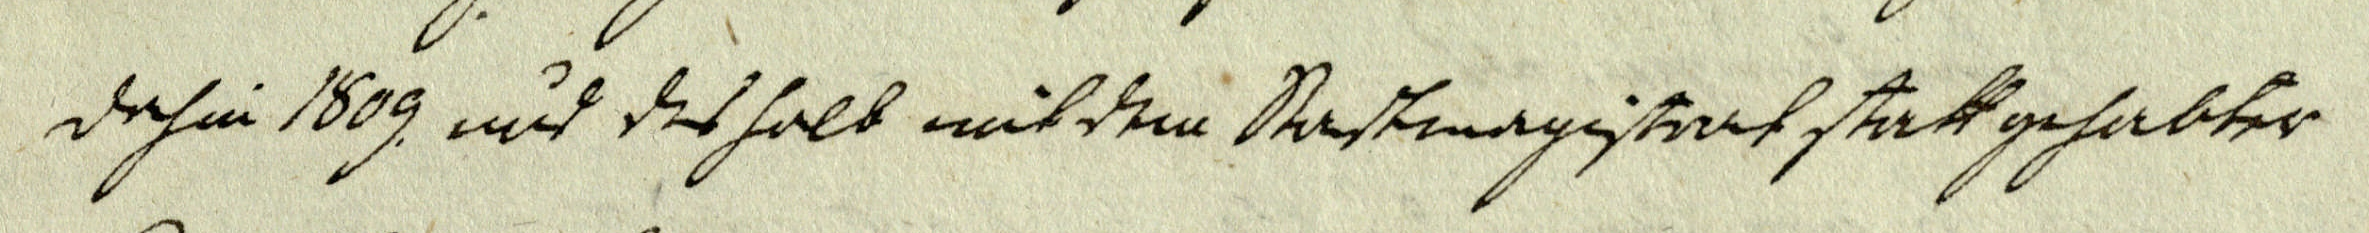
dahin 1809 und deshalb mit dem Stadtmagistrat statt gehabter
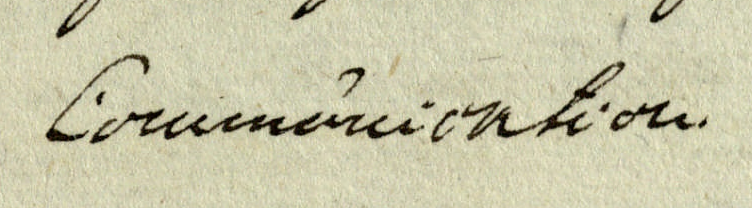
Communication.
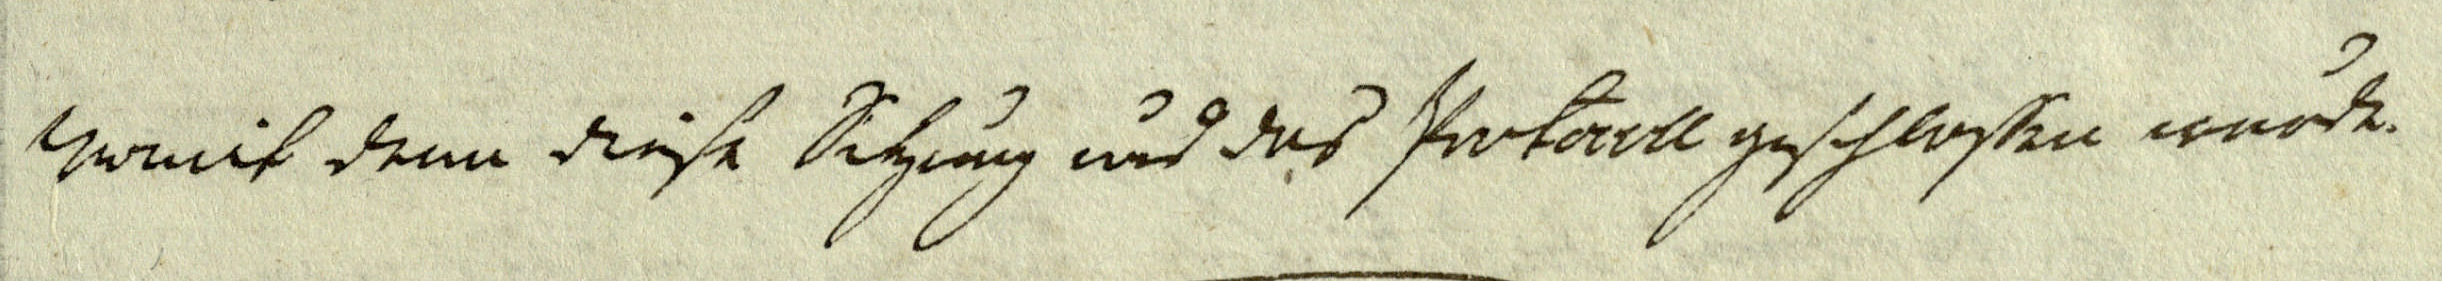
Womit denn diese Sitzung und das Protocoll geschlossen wurde.
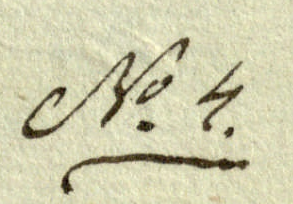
No 4.
